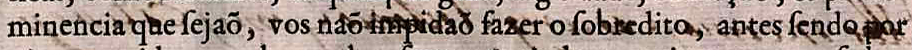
minencia que sejaõ, vos naõ impidaõ fazer o sobredito, antes sendo por
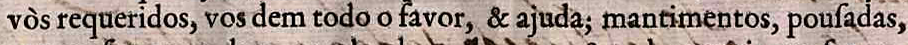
vòs requeridos, vos dem todo o favor, & ajuda; mantimentos, pousadas,
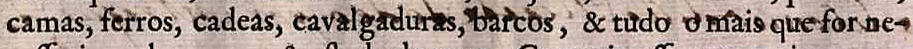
camas, ferros, cadeas, cavalgaduras, barcos, & tudo o mais que for ne
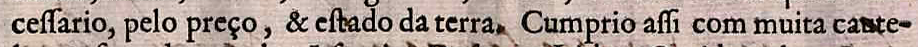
cessario, pelo preço, & estado da terra. Cumprio assi com muita caute
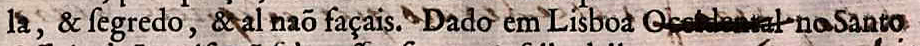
la, & segredo, & al naõ façais. Dado em Lisboa _ no Santo
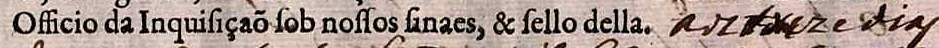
Officio da Inquisiçaõ sob nossos sinaes, & sello della. aos treze dias
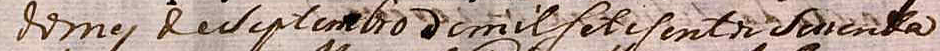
do mes de septembro de mil seteCentoz sessenta
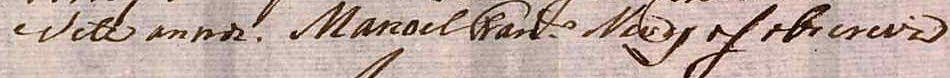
e sete annoz. Manoel Fran.co Neves o sobscrevi
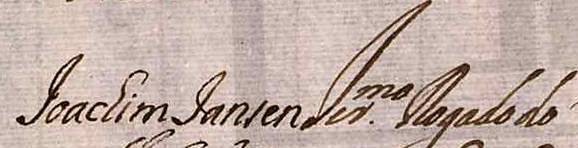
Ioachim Iansen Ier.mo Rogado do
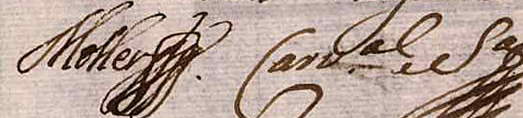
Moller Carv.al e Sa
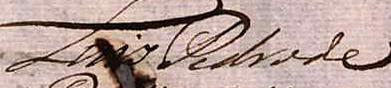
Luis Pedro de
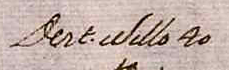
Dest. e Sello 40
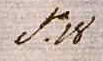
d.a 18
